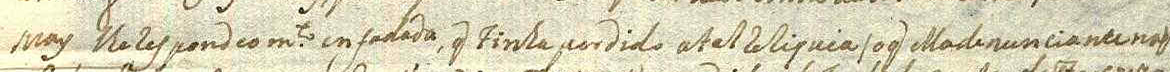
May lhe respondeo m.to enfadada, q̄ tinha perdido a tal Reliquia / o q̄ ella denunciante naõ
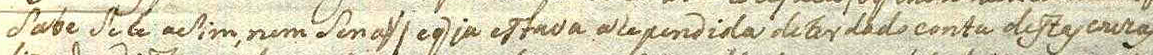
sabe se he aSim, nem Se naõ/ e q̄ já estava aRependida de ter dado conta destas couzas
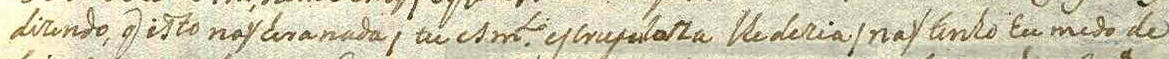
dizendo, q̄ isto naõ hera nada/ tu es m.to escrupoloza lhe dezia./ naõ tenho Eu medo de
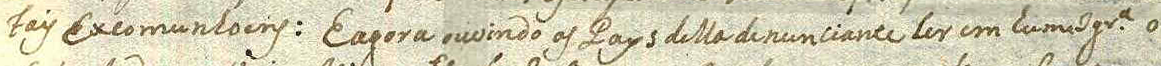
tais Excomunhoens: E agora ouvindo os Pays della denunciante Ler em huma Igr.a o
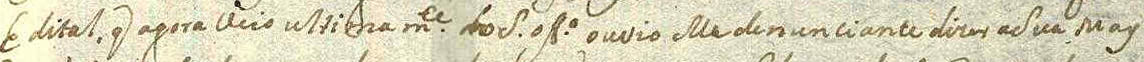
Edital, q̄ agora ueio ultimam.te do S. off.o ouvio ella denunciante dizer a Sua May
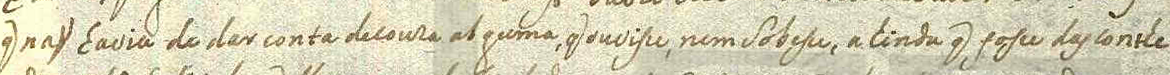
q̄ naõ havia de dar conta de couza alguma, q̄ ouvisse, nem Sobesse, ahinda q̄ fosse das conthe
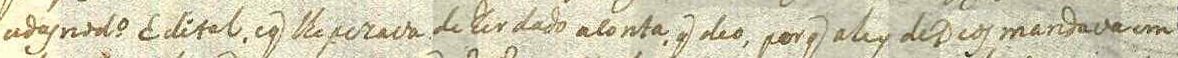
udas no d.o Edital, e q̄ lhe pezava de ter dado a conta, q̄ deo, porq̄ a ley de Deos mandava em
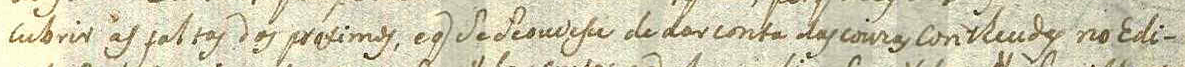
Cubrir as faltas dos proximos, e q̄ Se Se ouvesse de dar conta das couzas contheudas no Edi
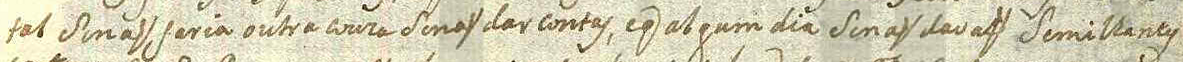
tal Se naõ faria outra couza Senaõ dar contas, e q̄ algum dia Se naõ davaõ Semilhantes
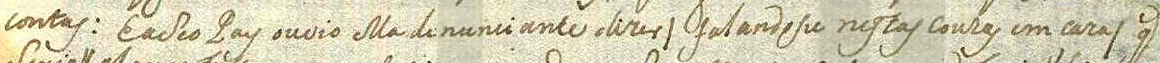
contas: E a Seo Pay ouvio ella denunciante dizer/ falandosse nestas couzas em caza/ q̄
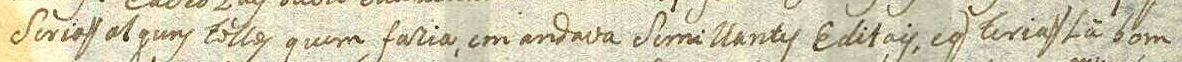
Seriaõ alguns tollos quem fazia, e mandava Semilhantes Editais, e q̄ teriaõ Là bom
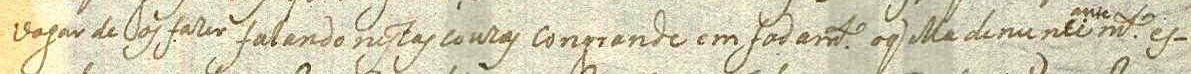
vagar de os fazer falando nestas couzas con grande emfadamto o q̄ ella denunciante mto es
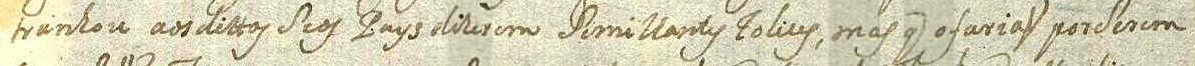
tranhou aos dittos Seos Pays dizerem Semilhantes tolices, mas q̄ o fariaõ por Serem
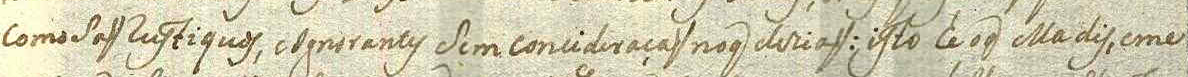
como saõ Rustiquos, e Ignorantes Sem concideraçaõ no q̄ diziaõ: isto he o q̄ ella dis, e me
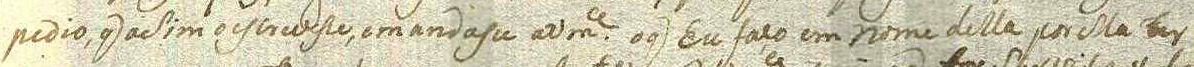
pedio, q̄ asim o escrevesse, e mandasse a v m.ce o q̄ Eu faço em nome della por ella ter
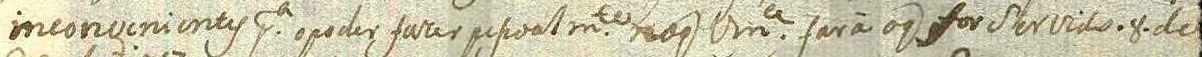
inconuenientes p.a o poder fazer pessoalm.te no q̄ V m.ce farà o q̄ for Servido .8. de
